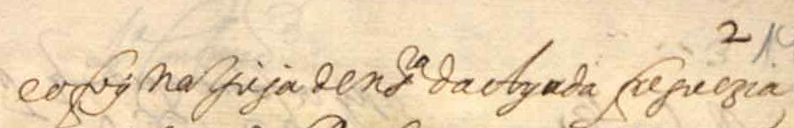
e o foy na Jgrija de ns.ra da Ayuda freguezia
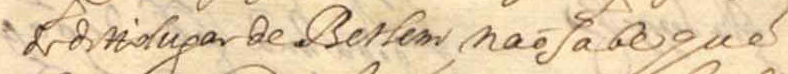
do ditto lugar de Betlem, naõ sabe quē
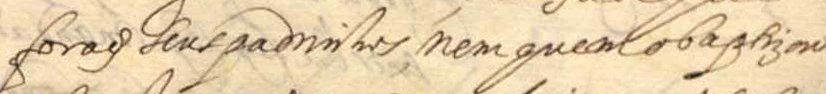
foraõ seus padrinhos nem quem o baptizou
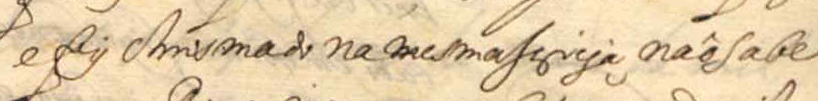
e foy chrismado na mesma Jgrija, naõ sabe
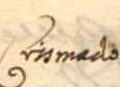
Crismado
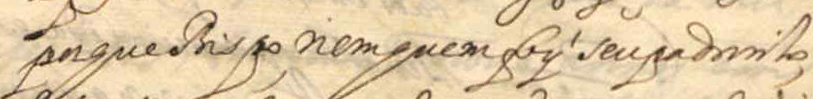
por que Bispo, nem quem foy seu padrinho,
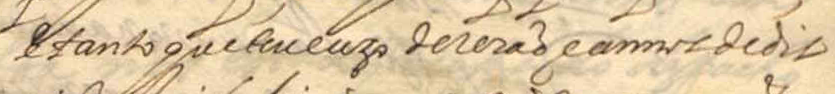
e tanto que teue uzo de rezaõ e annos de dis
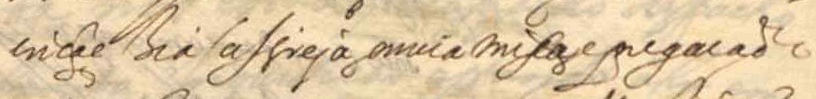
crição hia a Jgreja ouuia missa e pregaçaõ e
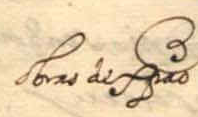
obras de xpaõ
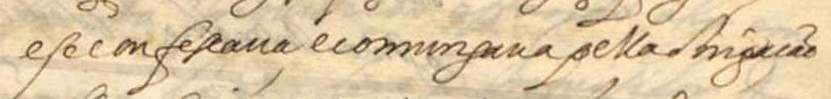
e se confessaua, e comungaua pella obrigaçaõ
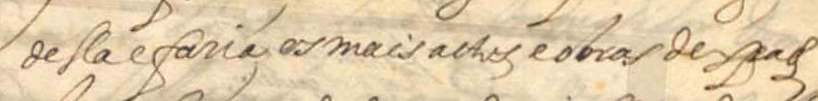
della e fazia os mais actos e obras de xpaõ
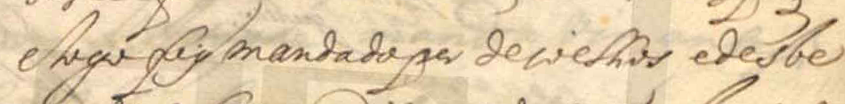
e logo foy mandado por de joelhos e deste
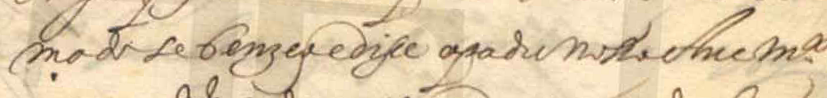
modo se benzeo e disse o padre nosso Aue m.a
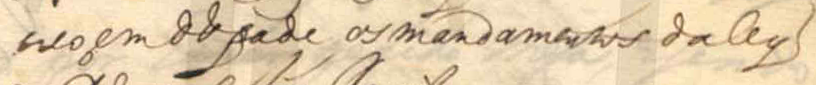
creo em ds pade os mandamentos da ley
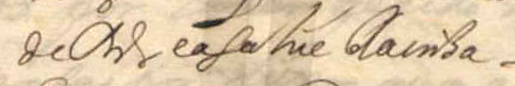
de Ds e a Salue Rainha.
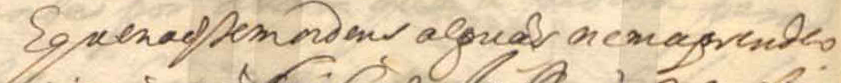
E que naõ tem ordens alguās nem aprendeo
